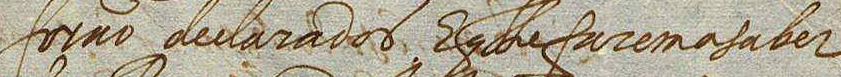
foraõ declarados. E q̄ lhe fazem a saber
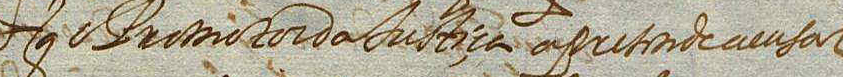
q̄ o Promotor da Iustiça a pretende acusar
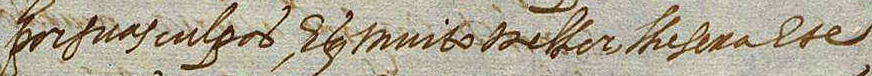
por suas culpas, E q̄ muito melhor lhe sera E te
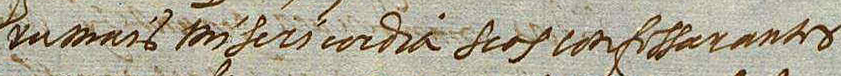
ra mais misericordia se as confessar antes
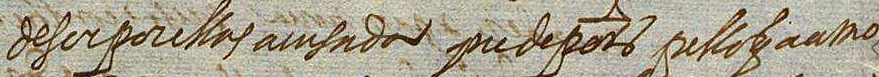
de ser por ellas acusada que depois pello q̄ a amo
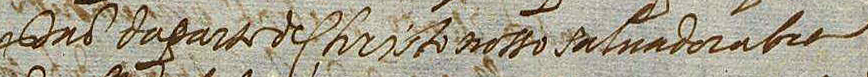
estaõ da parte de Christo nosso saluador abra
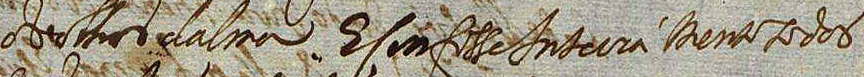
os olhos dalma. E Confesse Jnteiramente todas
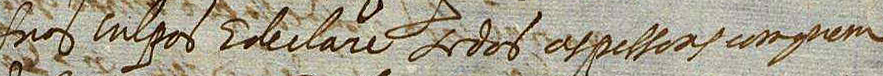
suas culpas E declare todas as pessoas com quem
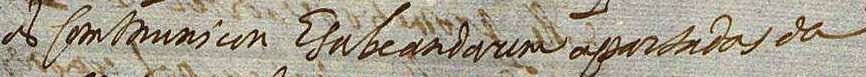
os Communicou E sabe andarem apartadas da
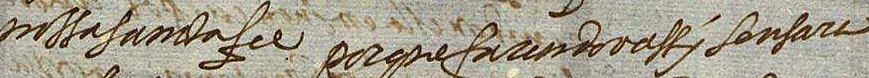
nossa sancta fee porque fazendoo assy se usara
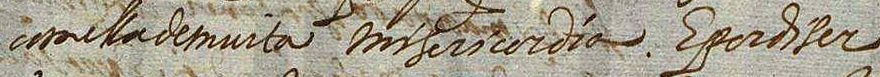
com ella de muita misericordia. E por diser
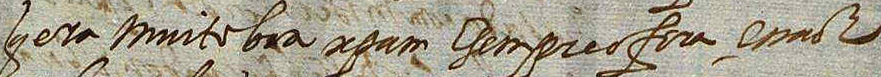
q̄ era muito boa xpam E sempre o fora, E naõ
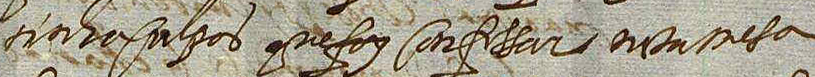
tinha culpas que foy Confessar nesta mesa
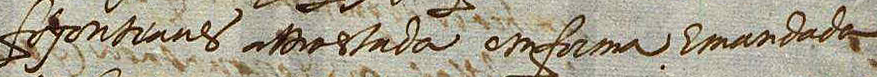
foy outra ues amoestada em forma E mandada
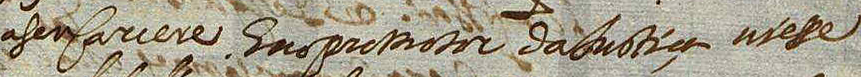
a seu Carcere. Eu o promotor da Iustiça uiesse
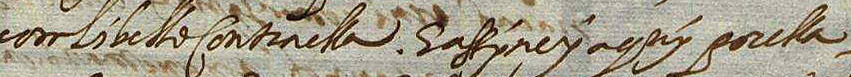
com Libello Contra ella. E assyney aquy por ella
